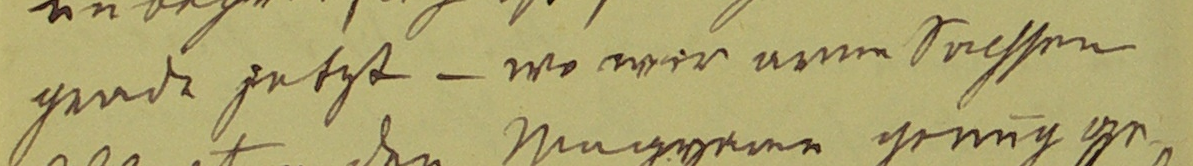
gerade jetzt,-- wo wir arme Sachsen
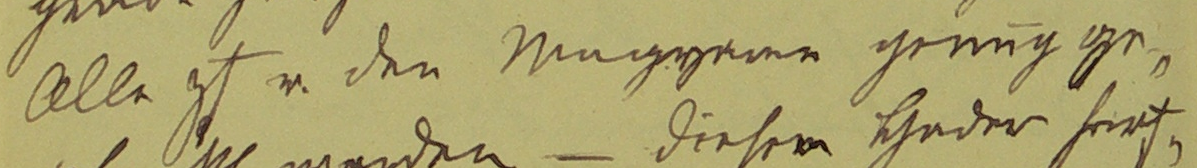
Alle zs von den Magyaren genug ge¬
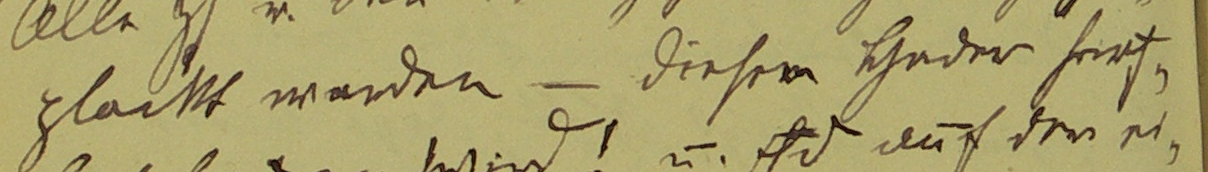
plackt werden -- dieser Hader herf
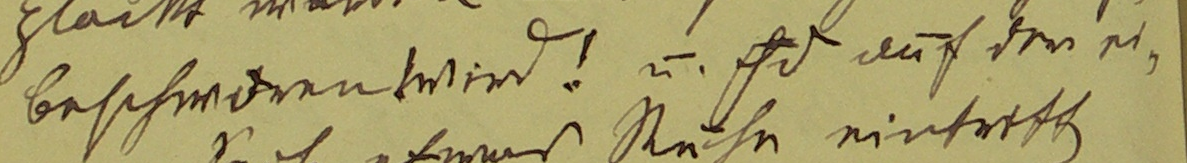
beschworen ! wird ! und chd auf der ei¬
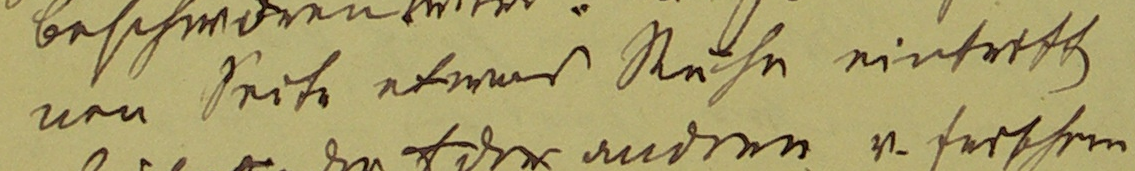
nen Seite etwas Ruhe eintritt,
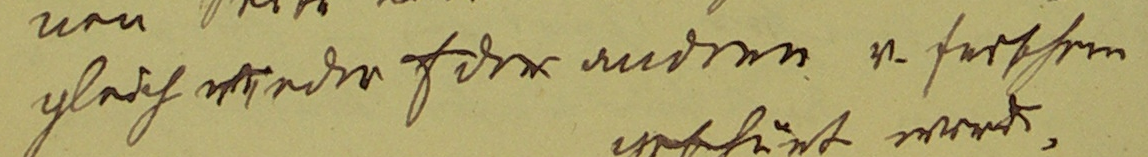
gleich wieder f der anderen v. frischem
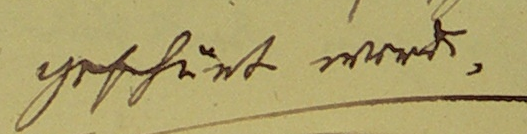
geschürt werde.
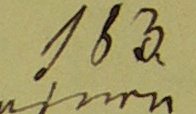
183
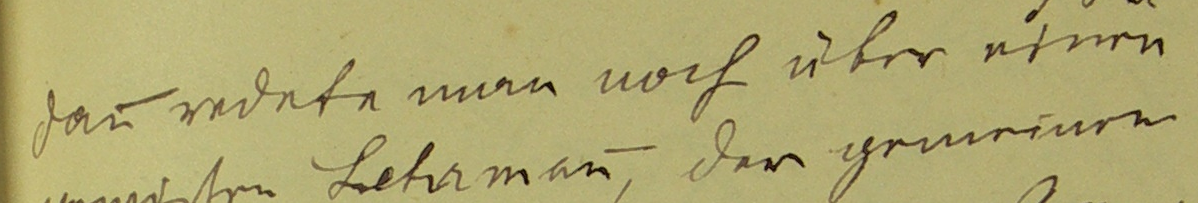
Dann redete man noch über einen
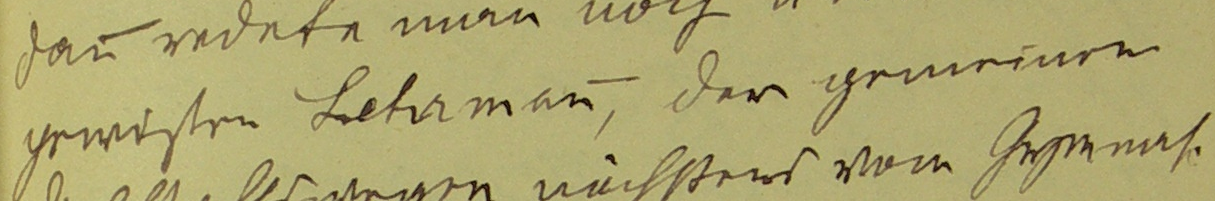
gewißen ???,,- der gemeinen
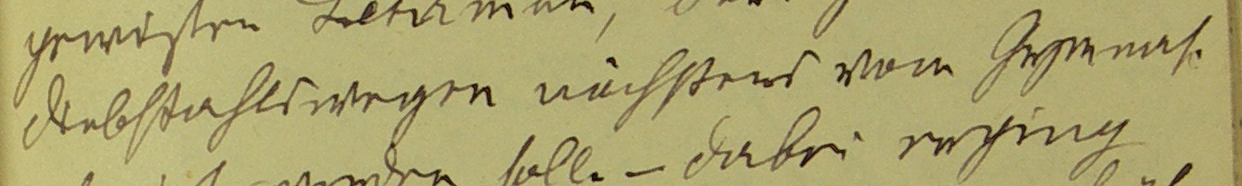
Diebstahls wegen nächstens vom Gymnas.
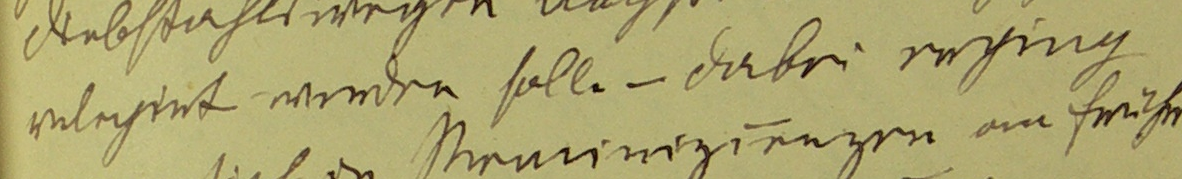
relegiert werden soll.- Dabei erging
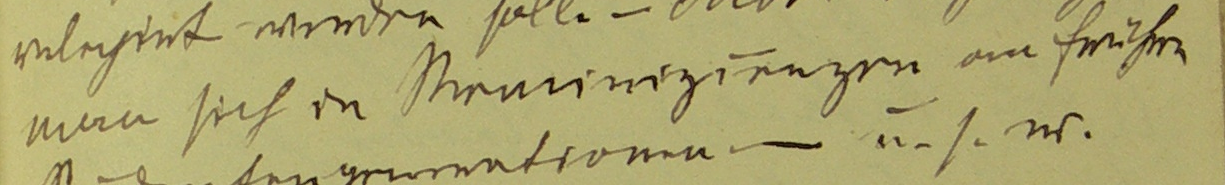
man sich in Erinnerungen an frühere
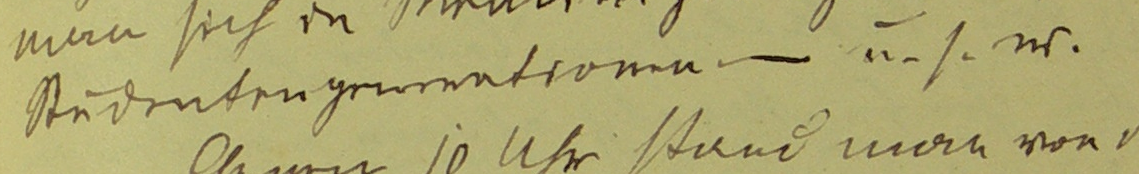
Studentengenerationen .- u.s.w.
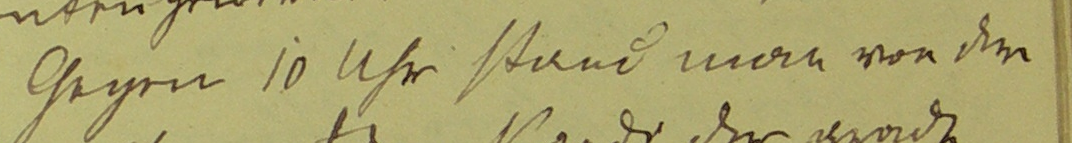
Gegen 10 Uhr stand man von der
